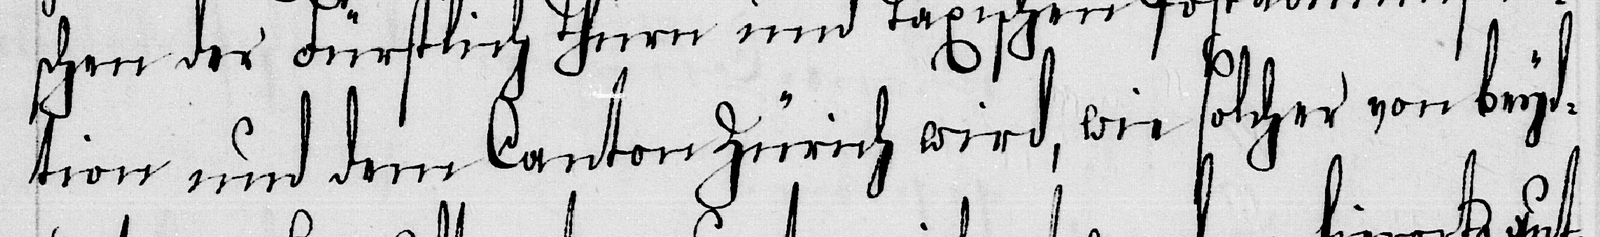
tion und dem Canton Zürich wird, wie solcher von beyd¬
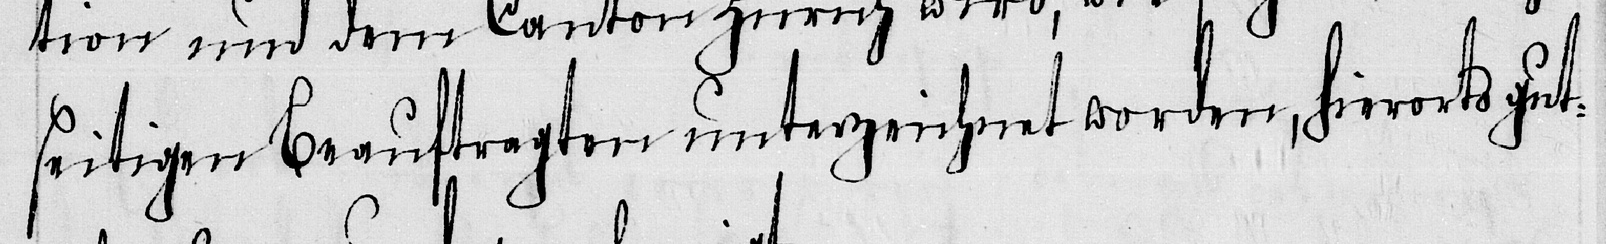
seitigen Beauftragten unterzeichnet worden, hierorts gut¬
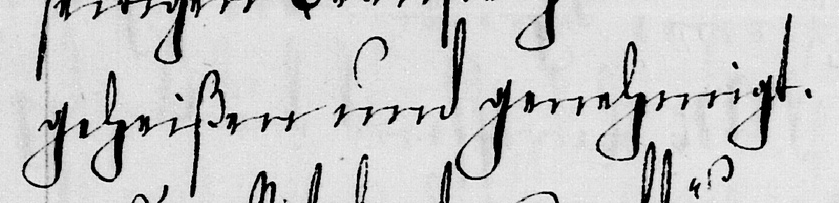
geheißen und genehmigt.
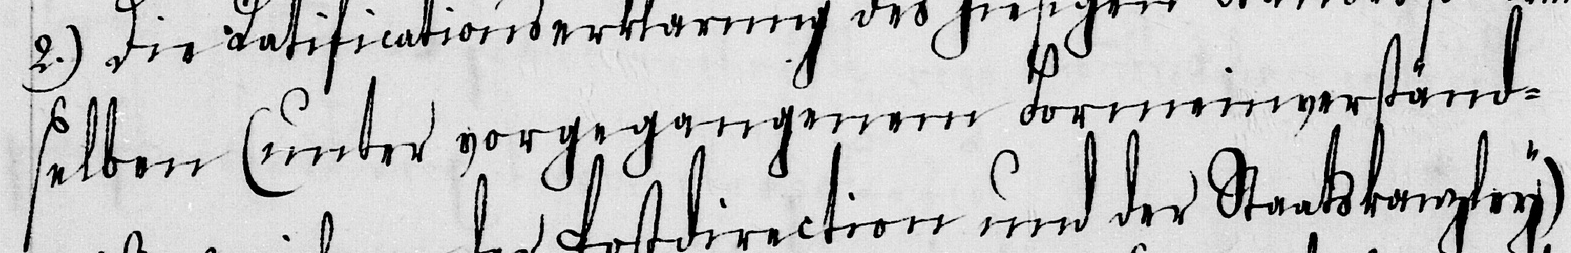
selben (unter vorgegangenem Formeinverständ¬
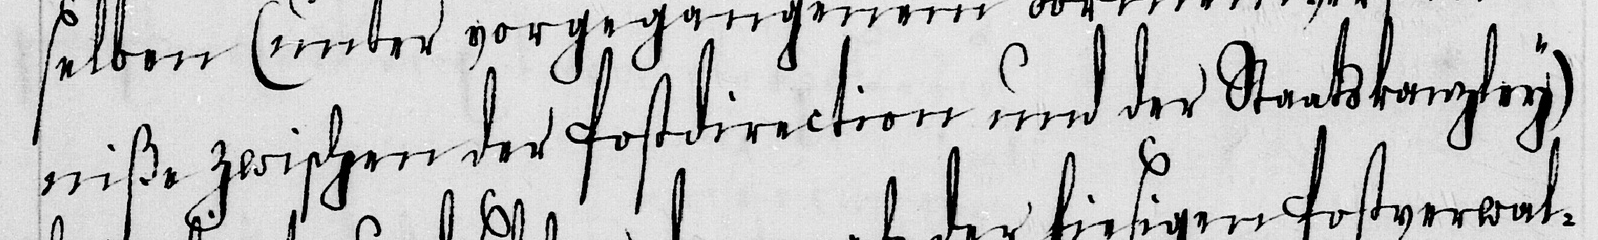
niße zwischen der Postdirection und der Staatskanzley)
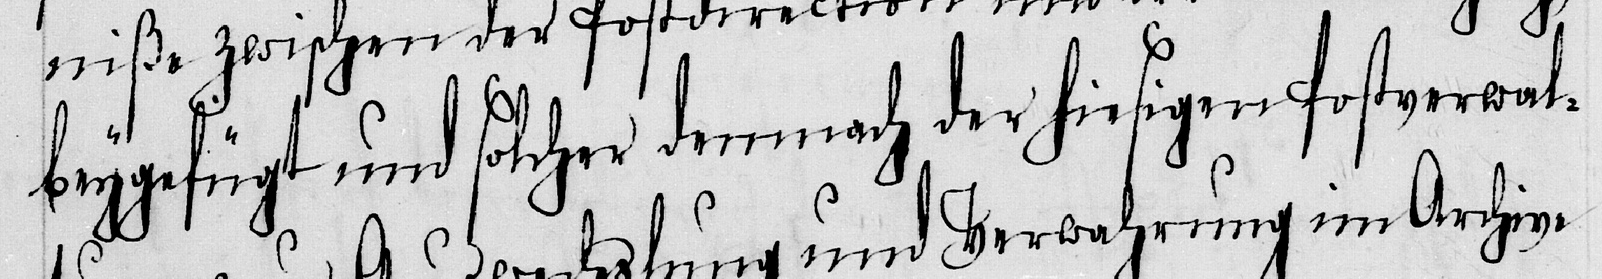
beygefügt und solcher demnach der hiesigen Postverwal¬
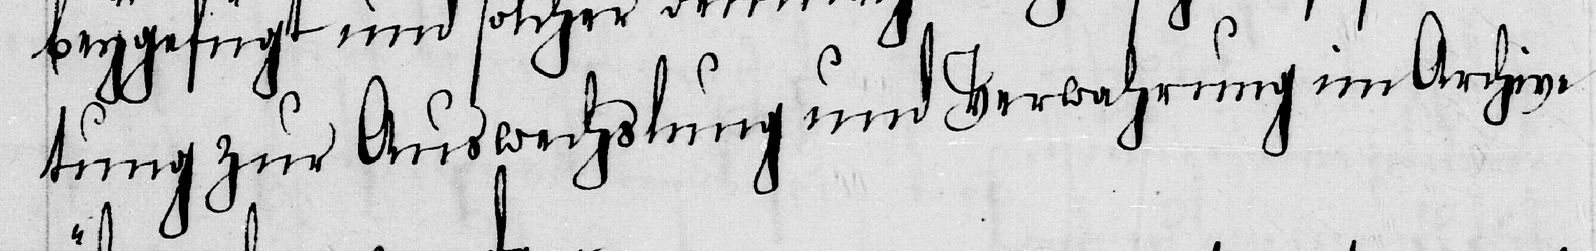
tung zur Auswechslung und Verwahrung im Archive
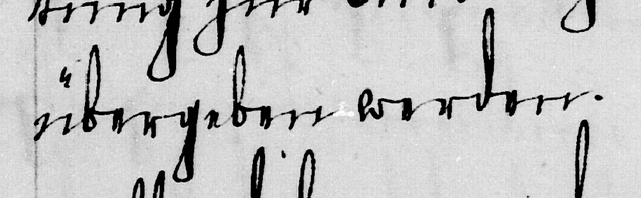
übergeben werden.
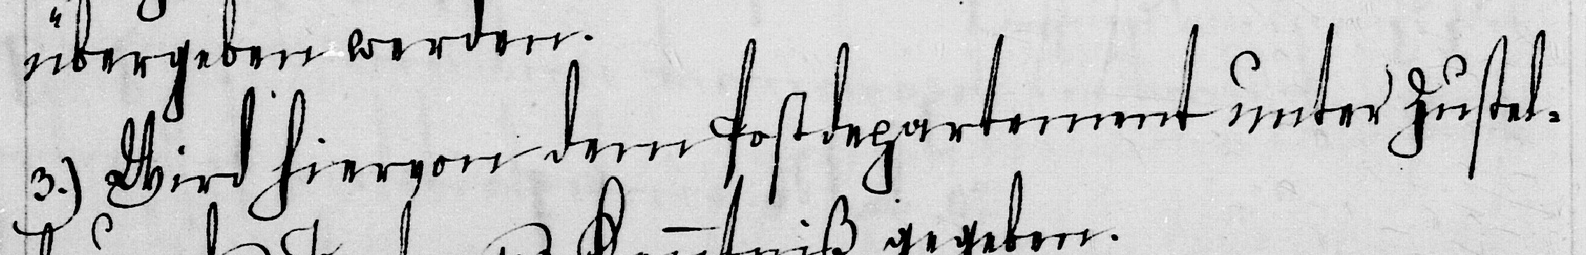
3.) Wird hiervon dem Postdepartement unter Zustel¬
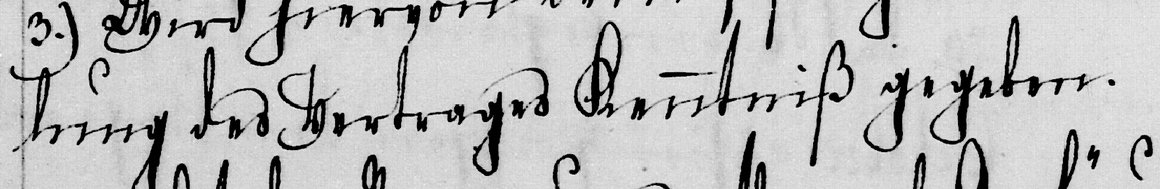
lung des Vertrages Kenntniß gegeben.
